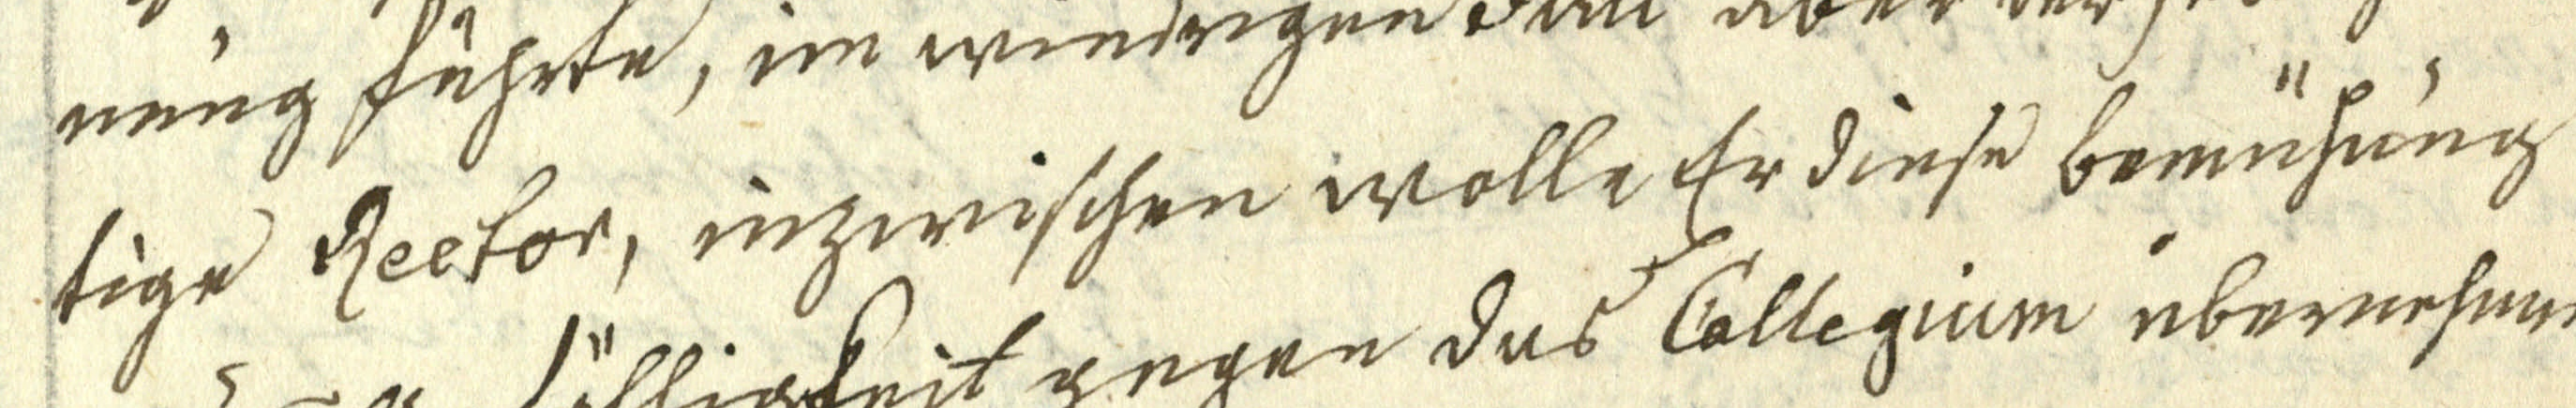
tige Rector, inzwischen wolle Er diese Bemühung
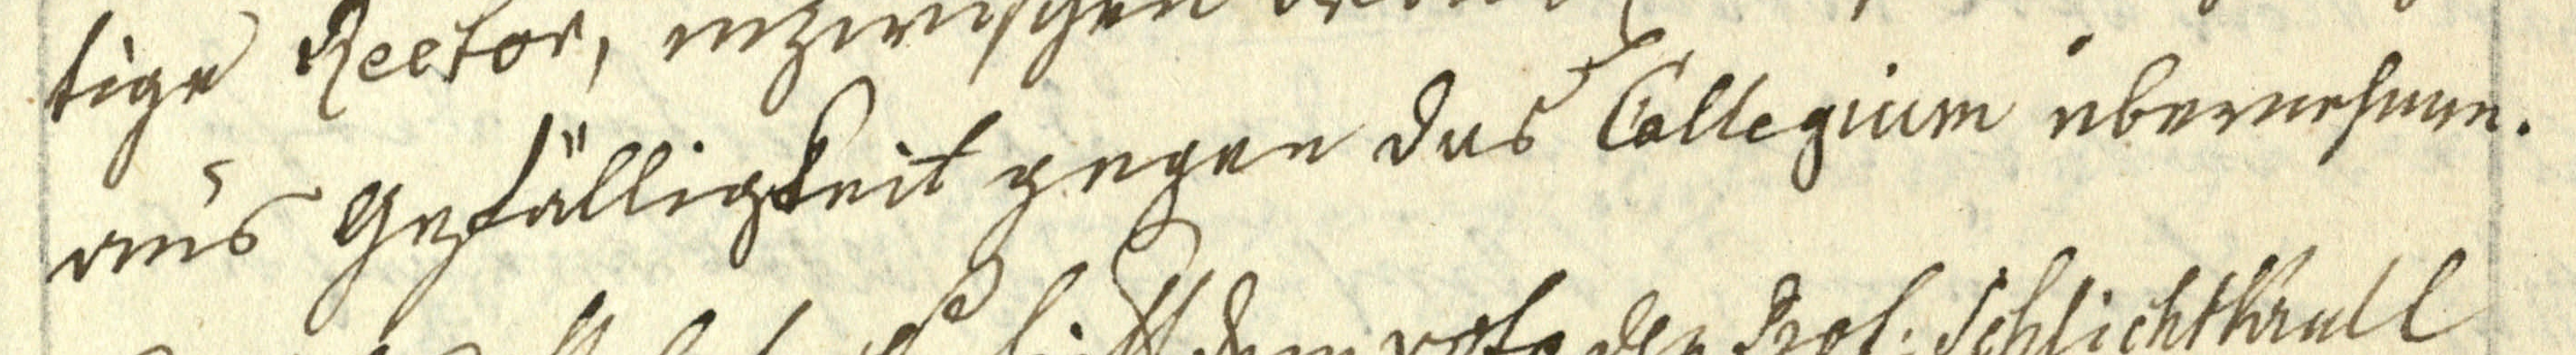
aus Gefälligkeit gegen das Collegium übernehmen.
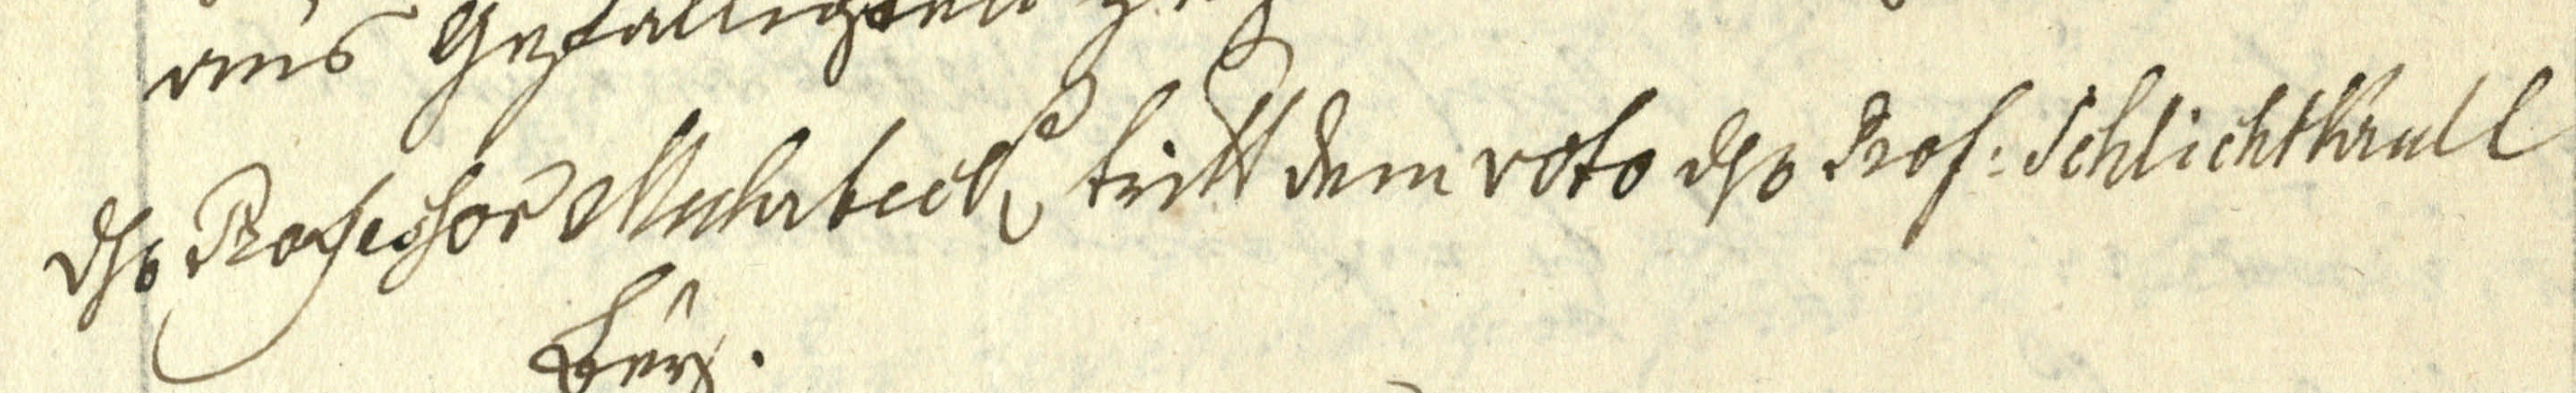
dh Professor Muhrbeck, tritt dem voto dh Prof. Schlichtkrull
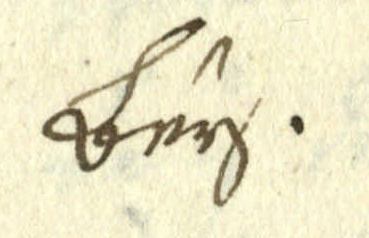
beÿ.
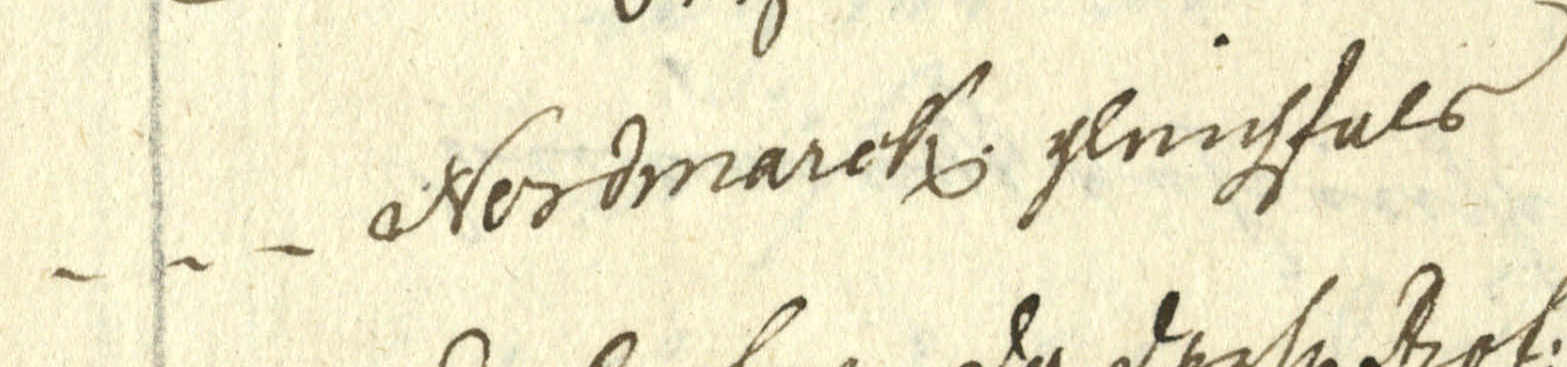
Nordmarck gleichfals
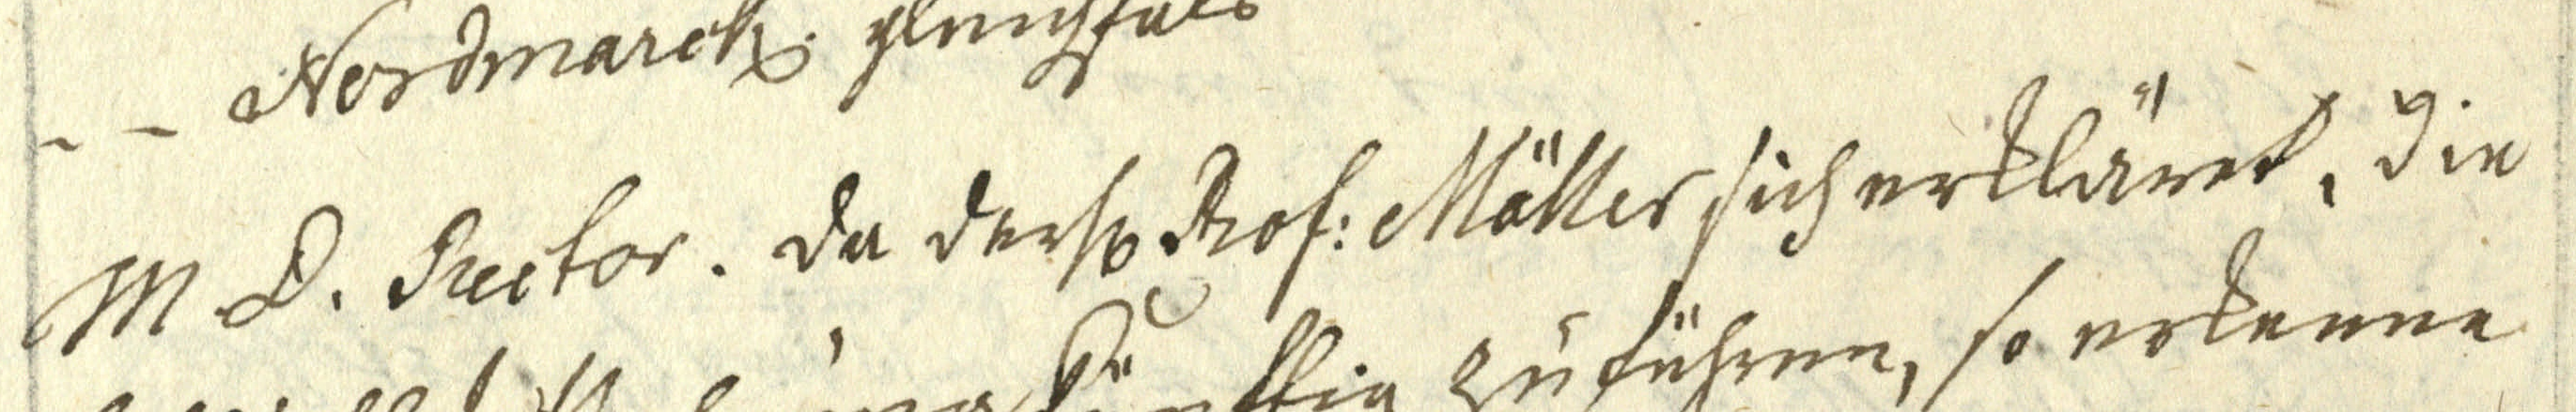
M. D. Rector. Da doch Prof. Möller sich erkläret, die
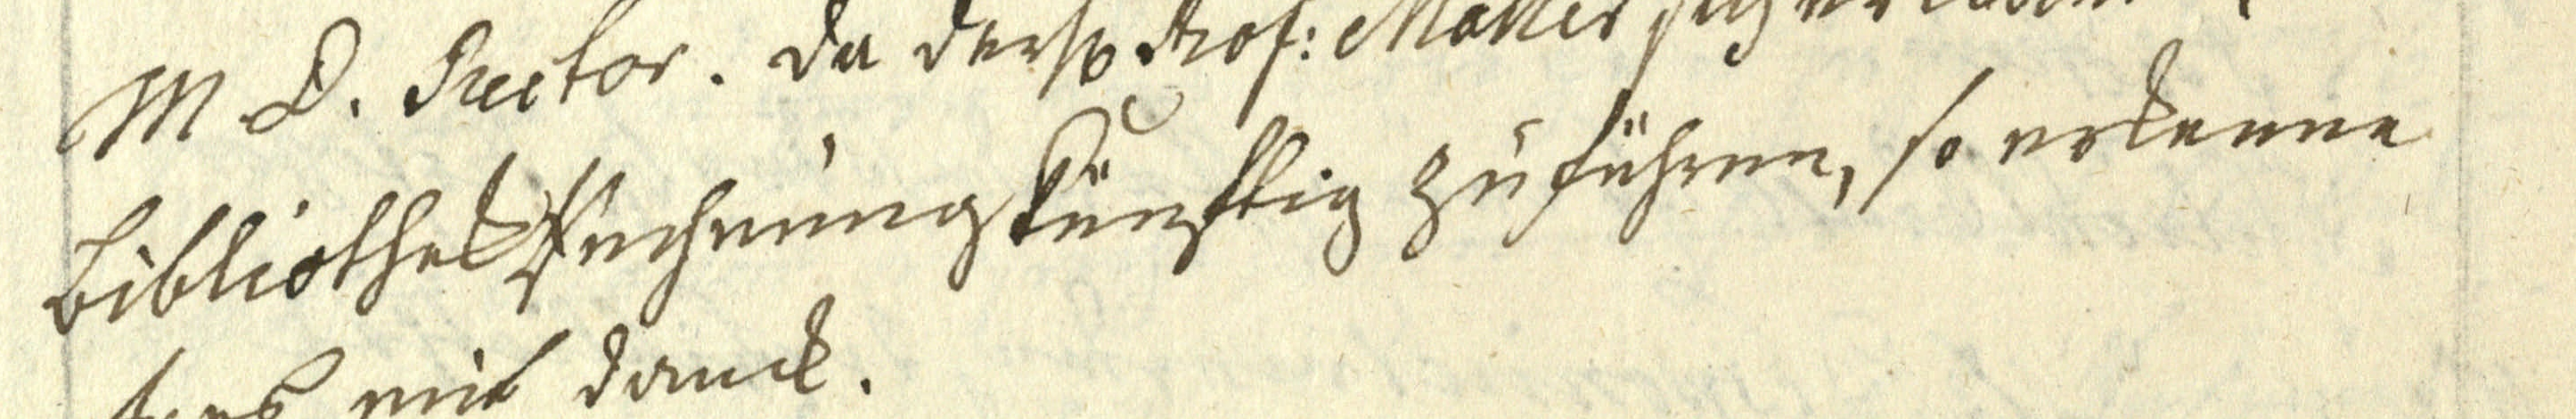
BibliothekRechnung künftig zu führen, so erkenne
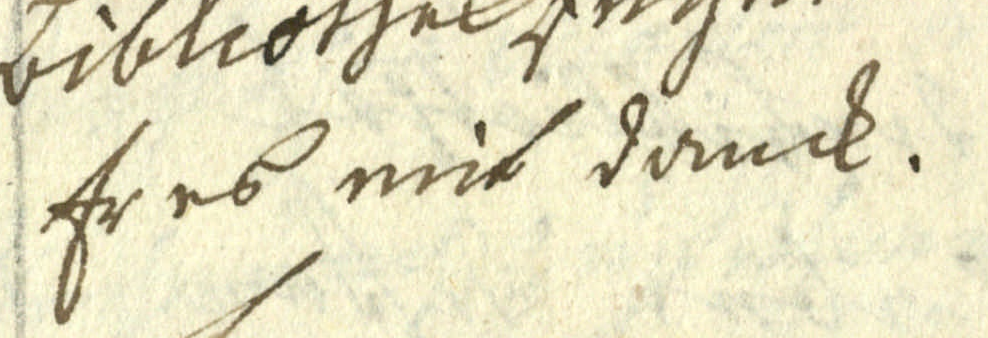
Er es mit Danck.
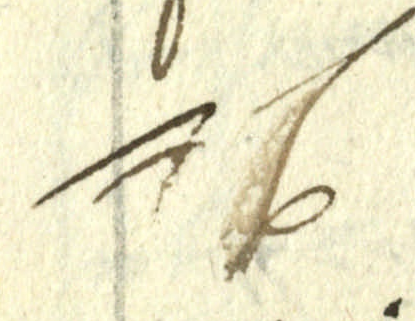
6
